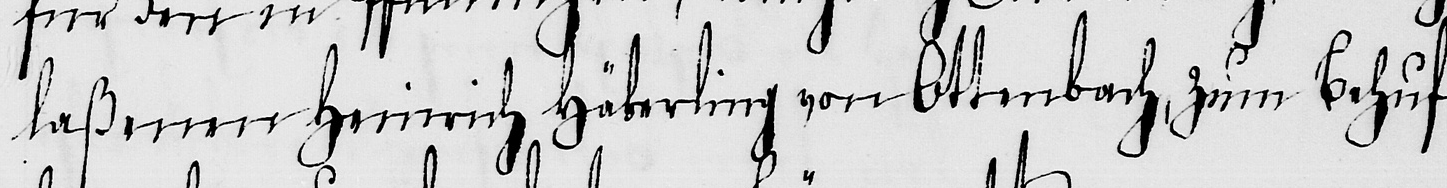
laßenen Heinrich Häberling von Ottenbach, zum Behuf
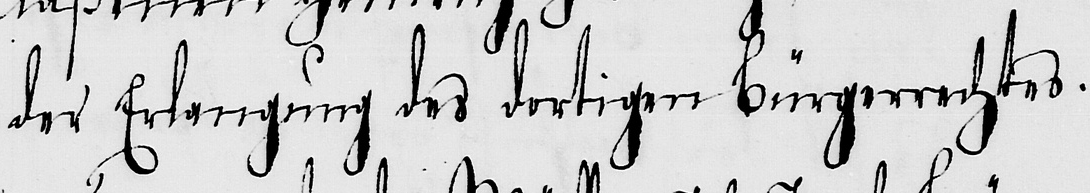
der Erlangung des dortigen Bürgerrechtes.
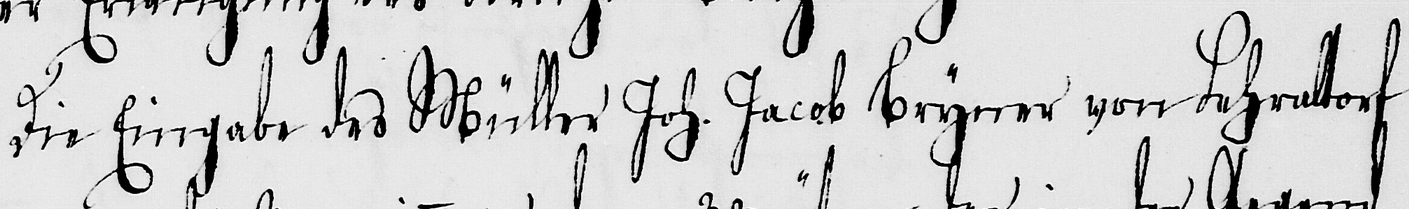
Die Eingabe des Müller Joh. Jacob Bryner von Fehraltorf
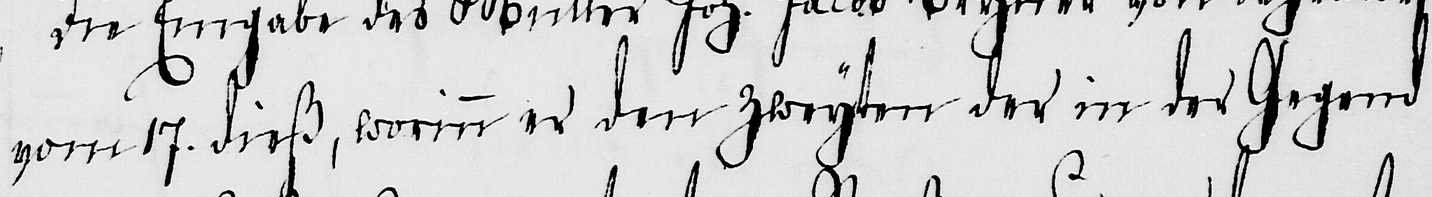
vom 17. dieß, worin er den zweyten der in der Gegend
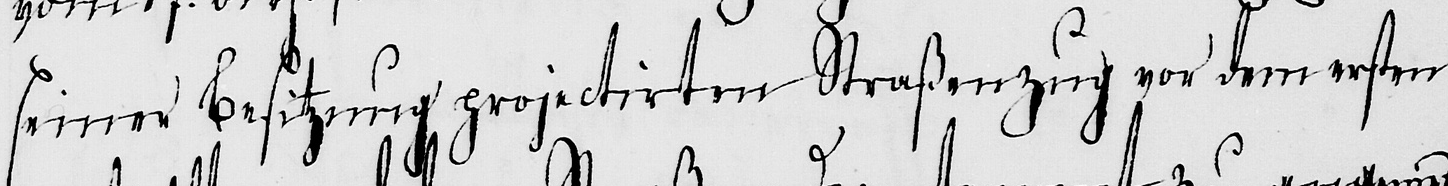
seiner Besitzung projectirten Straßenzug vor dem ersten
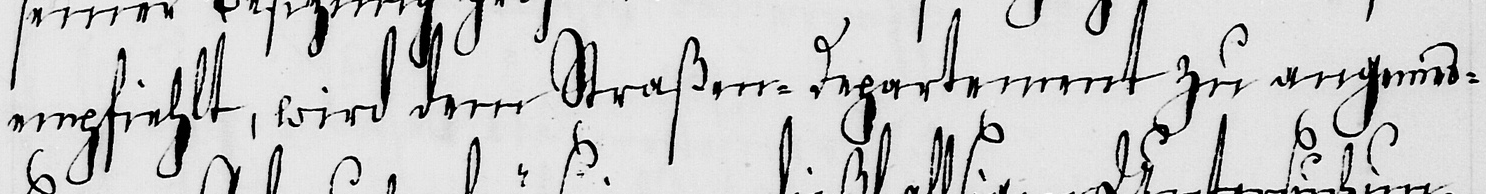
empfiehlt, wir dem Straßen-Departement zu angeme¬
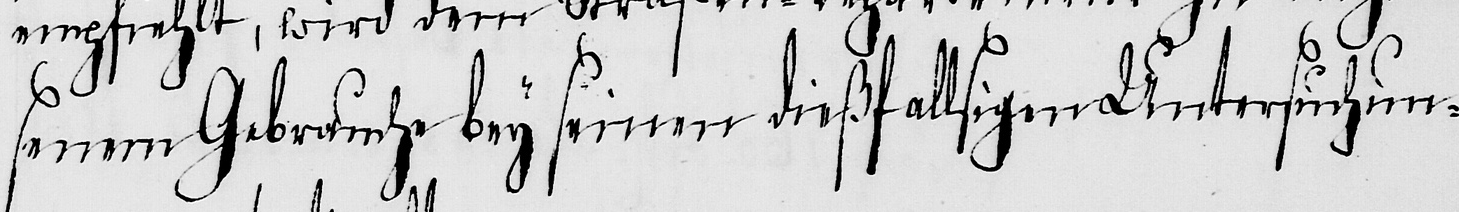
ßenem Gebrauche bey seinen dießfallsigen Untersuchun¬
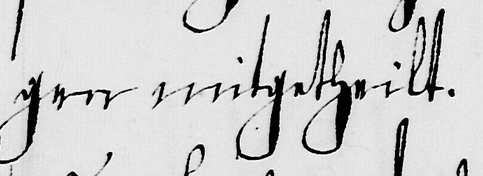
gen mitgetheilt.
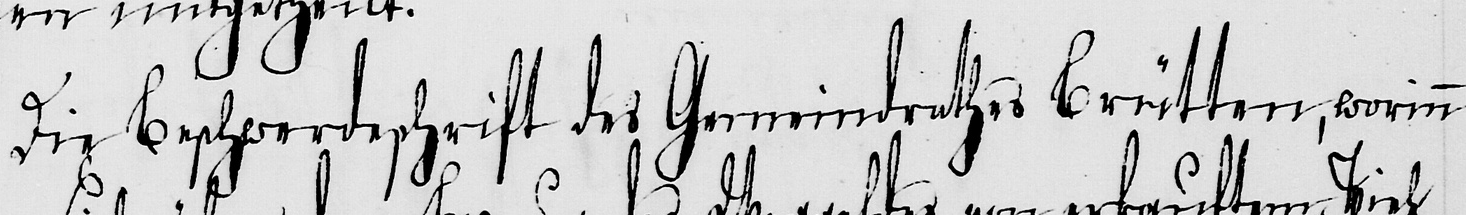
Die Beschwerdeschrift des Gemeindrathes Brütten, worin¬
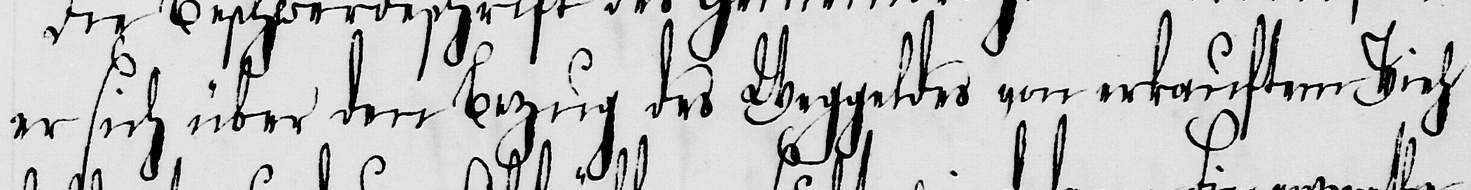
er sich über den Bezug des Weggeldes von erkauftem Vieh
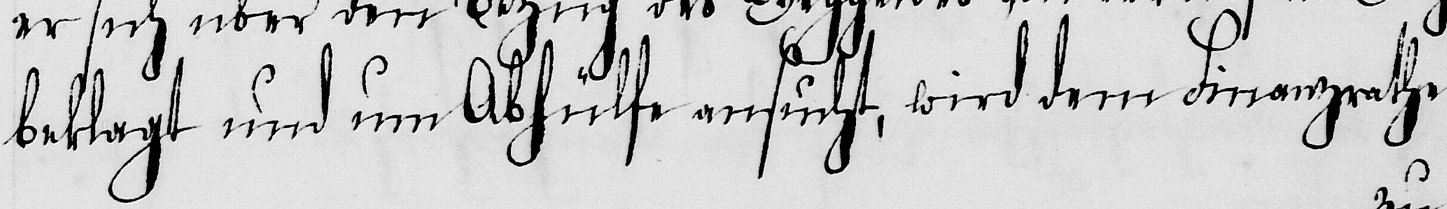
beklagt und um Abhülfe ansucht, wird dem Finanzrathe
